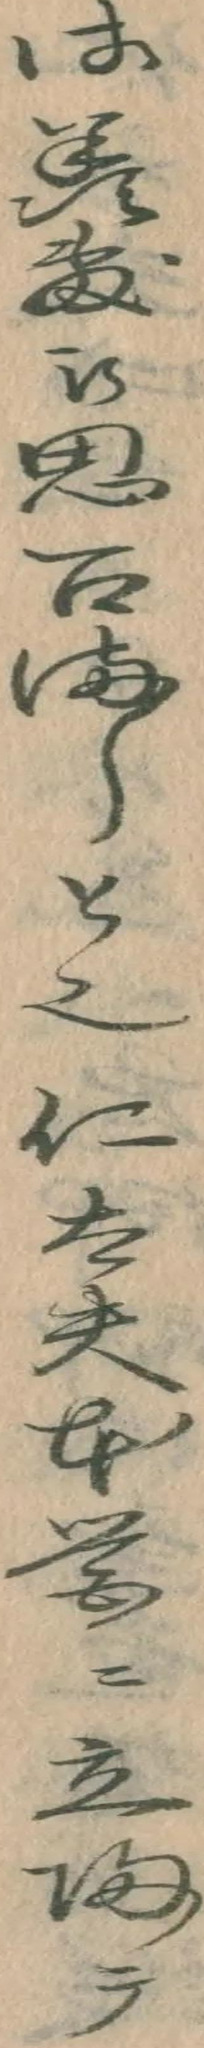御羨敷被思召満しと也仁太夫本営に立帰て
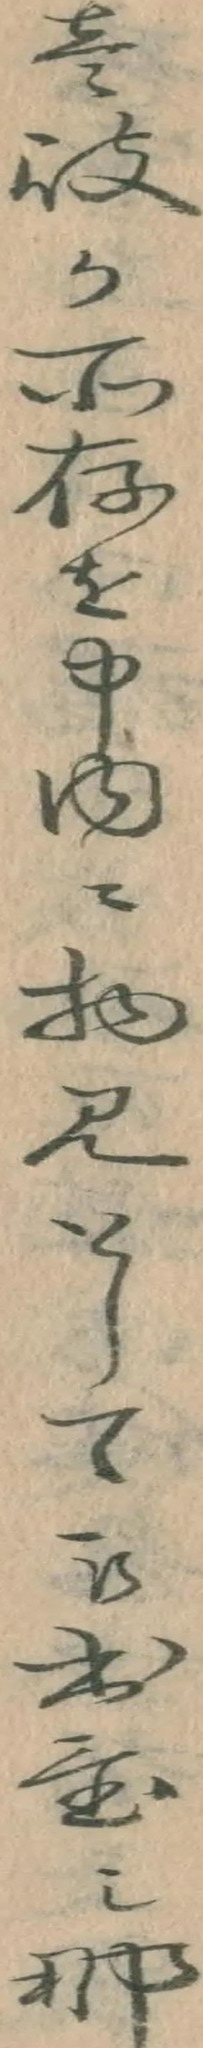壱岐か所存を申内に物見として被出置し那
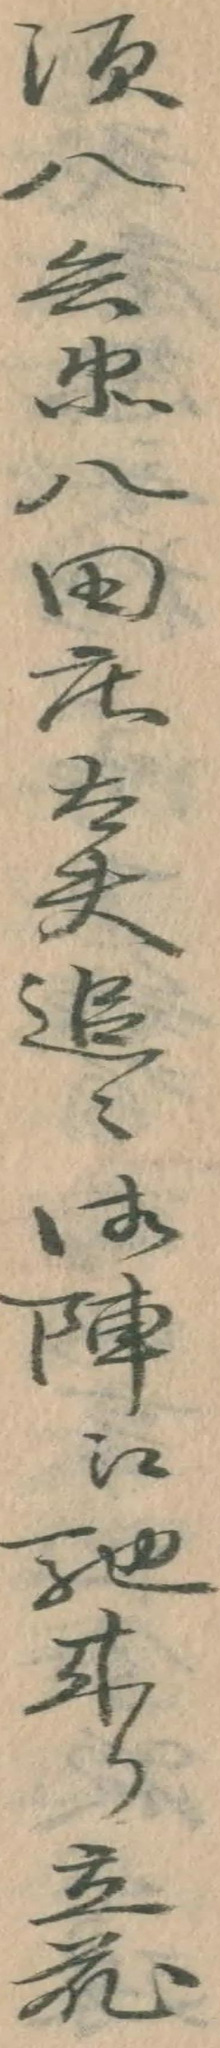須八兵衛八田庄太夫追々御陣江馳来り立花
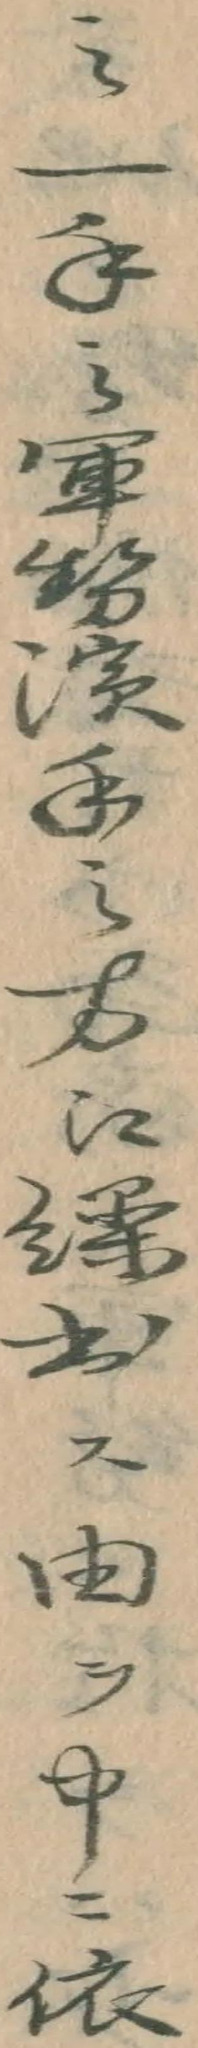之一手之軍勢浜手之方江繰出す由を申に依
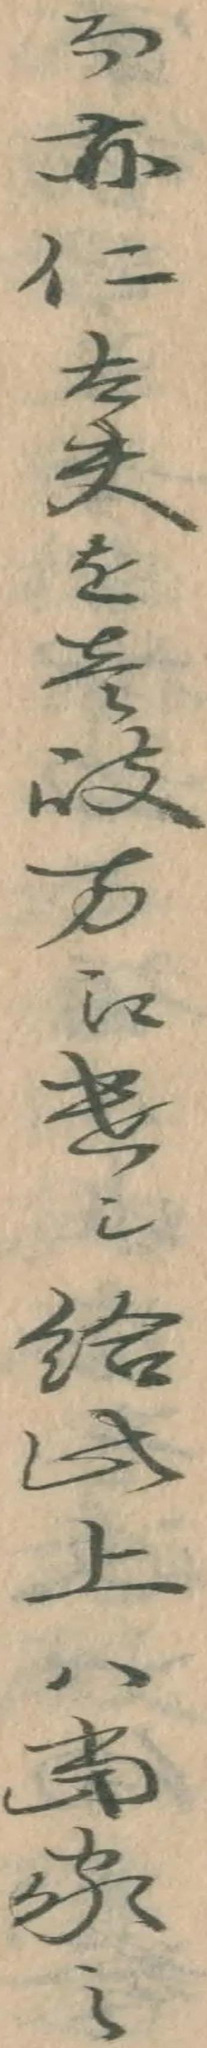而亦仁太夫を壱岐方江遣し給此上は当家之

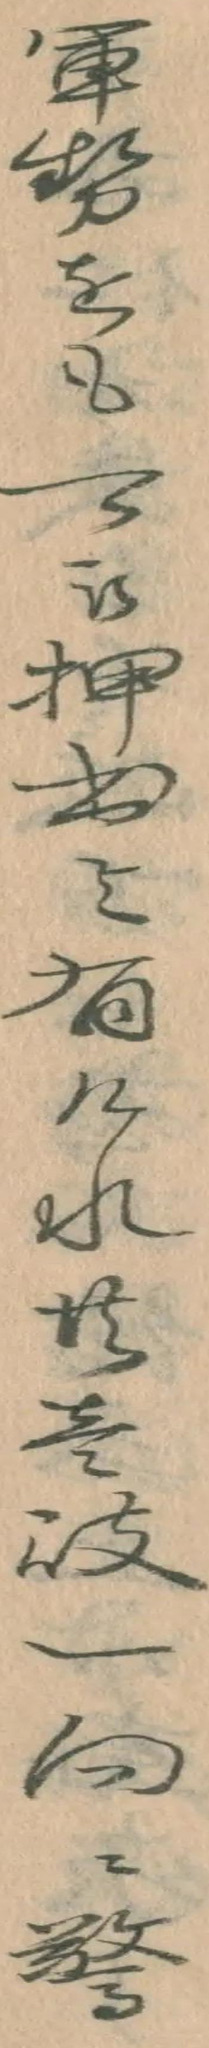軍勢をも可被押出与有けれ共壱岐一向に驚
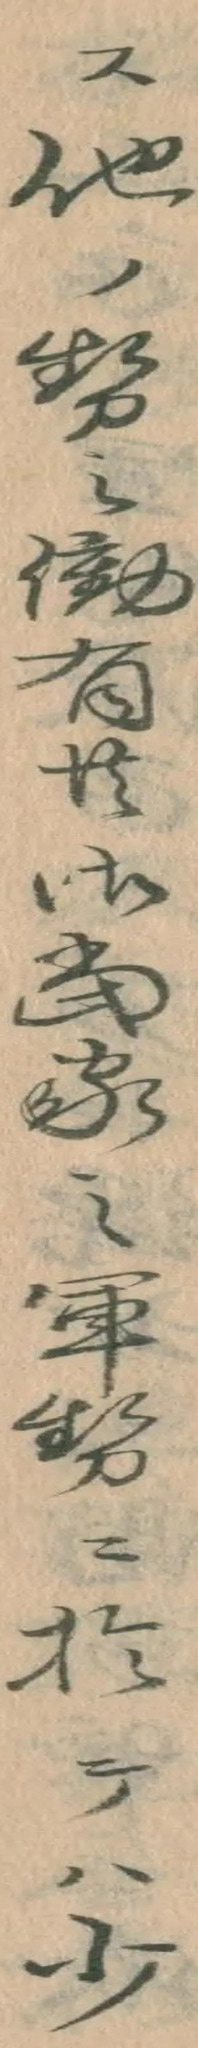す他之勢之働有共御当家之軍勢に於ては少
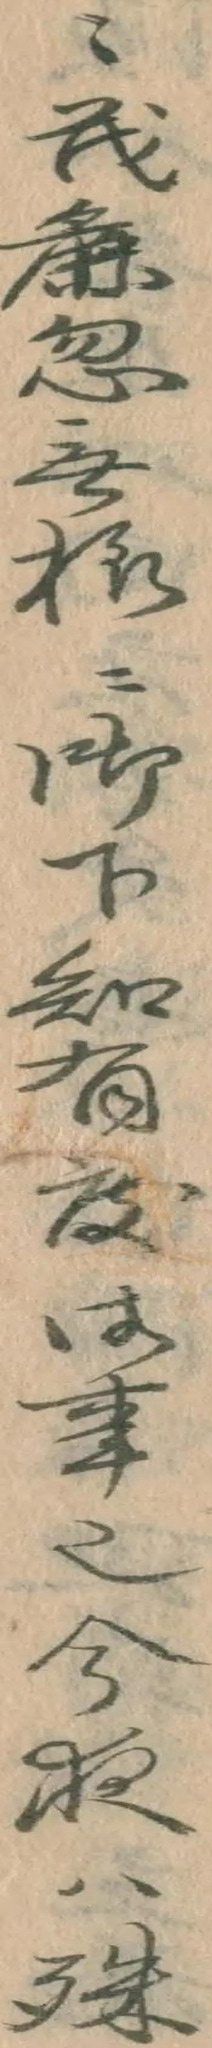々茂廉忽無様に御下知有度御事也今夜は殊
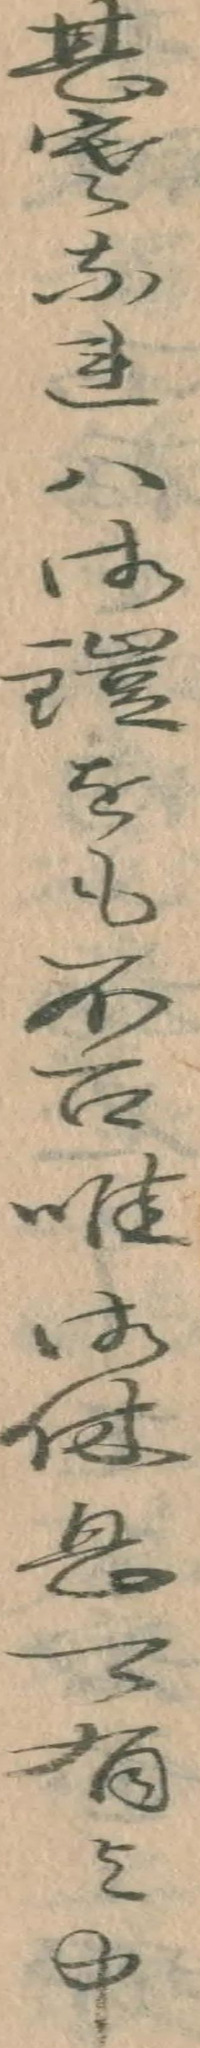甚寒な連は御鎧をも不召唯御休息可有与申
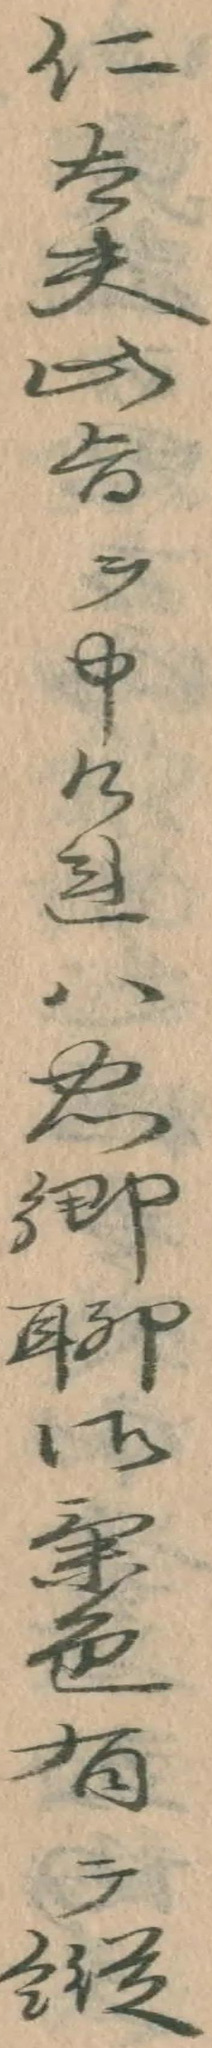仁太夫此旨を申け連は忠郷聊御気色有て縦
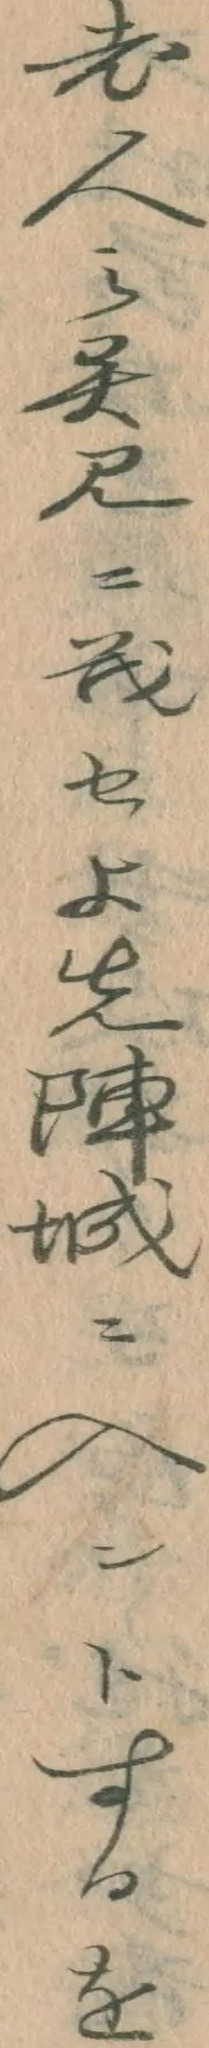老人之異見に茂せよ先陣城に入んとするを
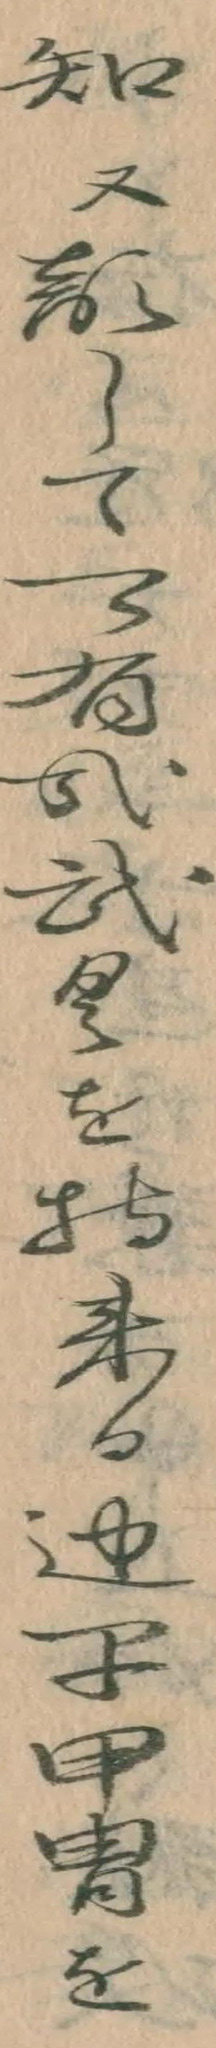知ぬ顔して可有哉武具を持来る迚早甲冑を
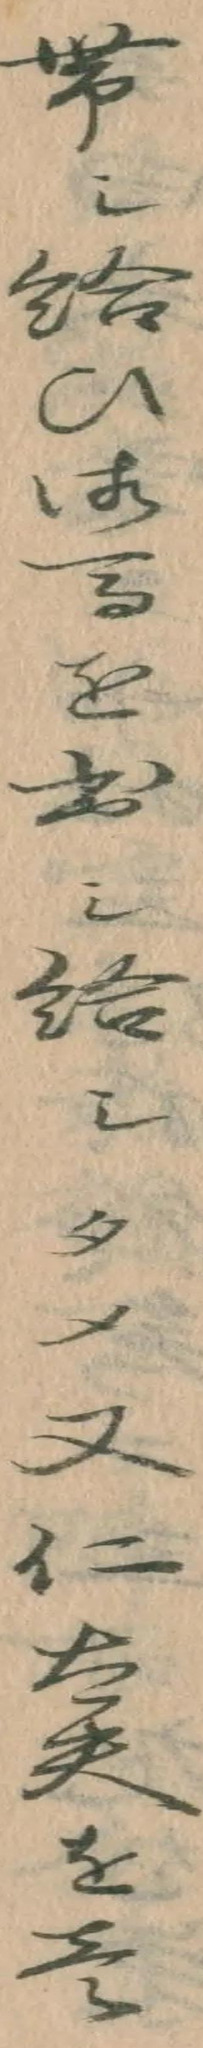帯し給ひ御馬を出し給しため又仁太夫を壱
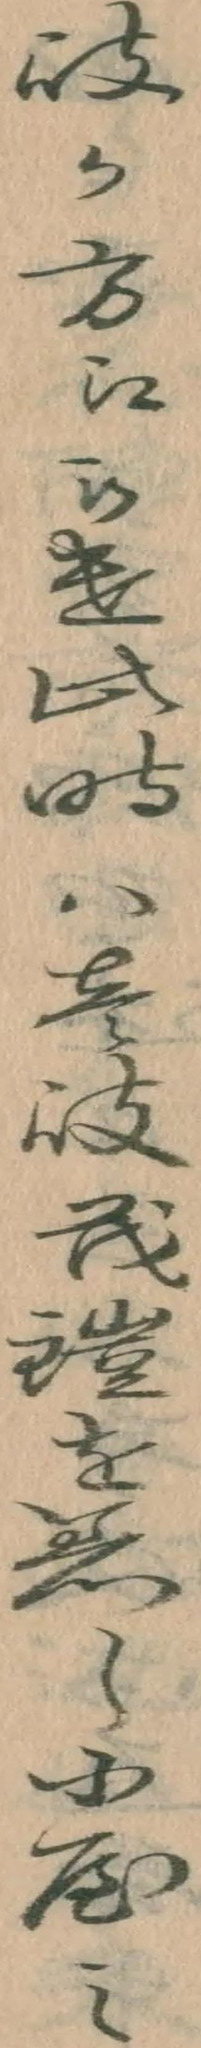岐か方江被遣此時は壱岐も鎧を着し小屋之
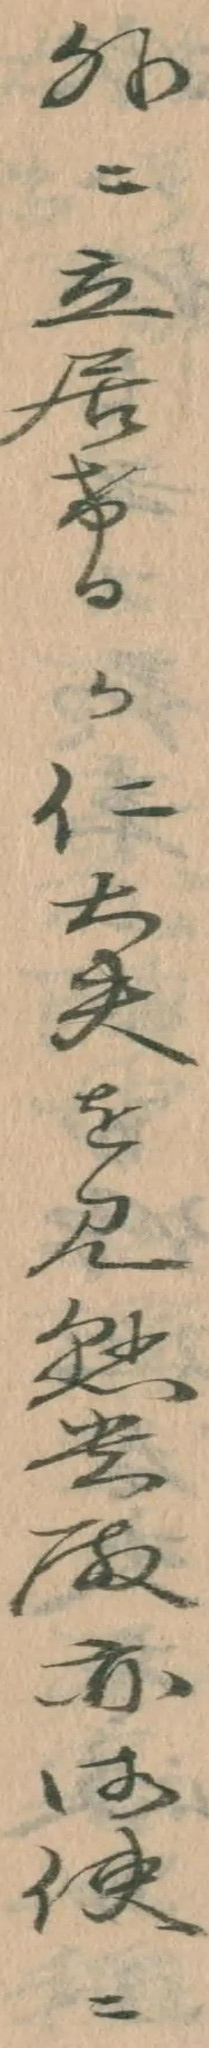外に立居希るか仁太夫を見懸貴殿亦御使に
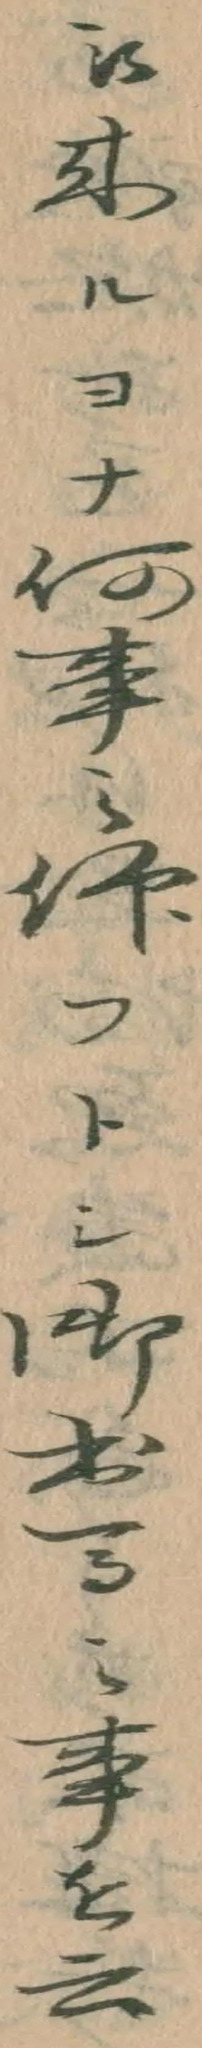被来るよな何事之仰ふとし御出馬之事を云
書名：切支丹御退治記 49巻. [4]
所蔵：国立国会図書館 National Diet Library, JAPAN
